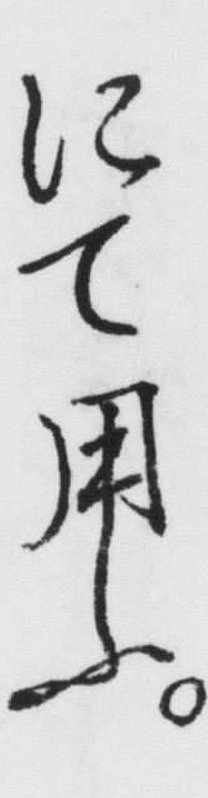にて用ふ。
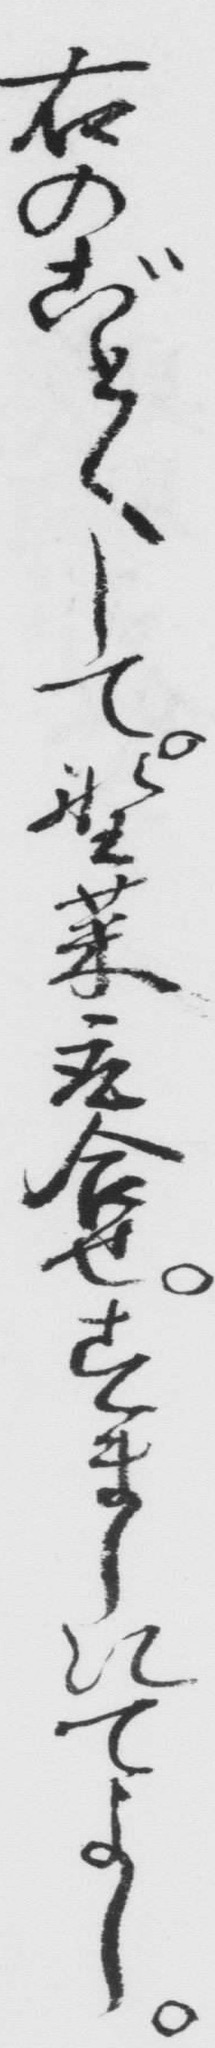○右のごとくして。野菜取合せ。すましにしてよし。
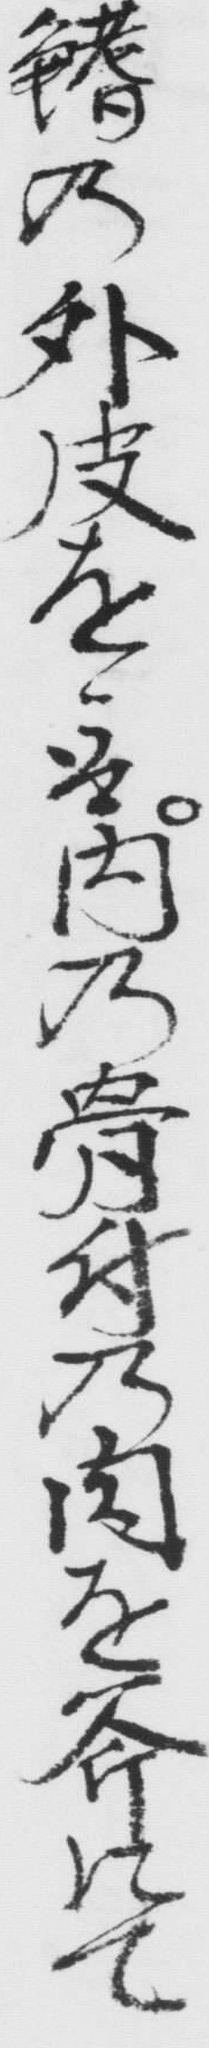大剥鰭の外皮を取。内の骨付の肉を斧にて
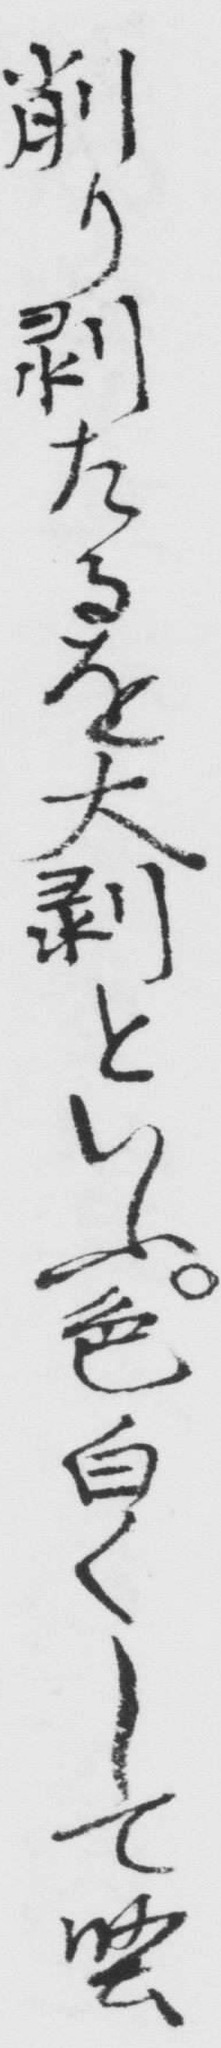削り剥たるを大剥といふ。色白くして堅
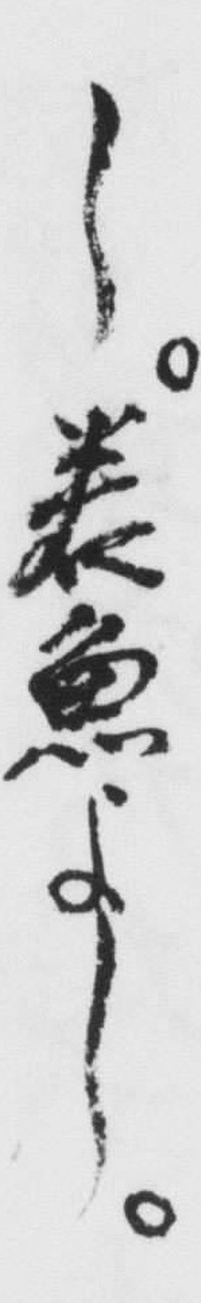し。若魚よし。
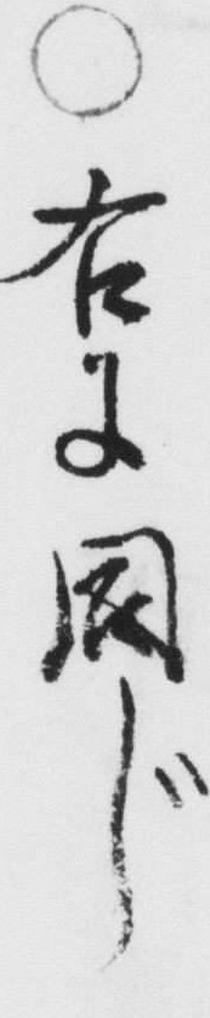○右に同じ

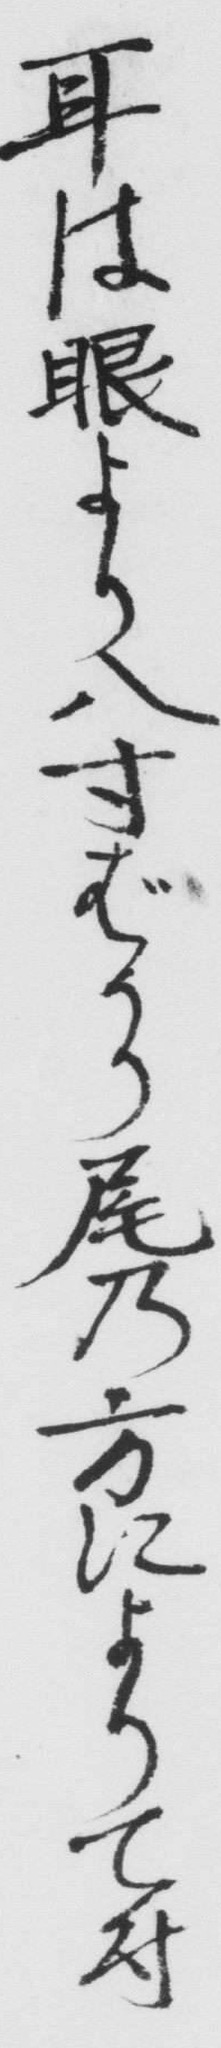耳ゴ耳は眼より八寸ばかり尾の方によりて付
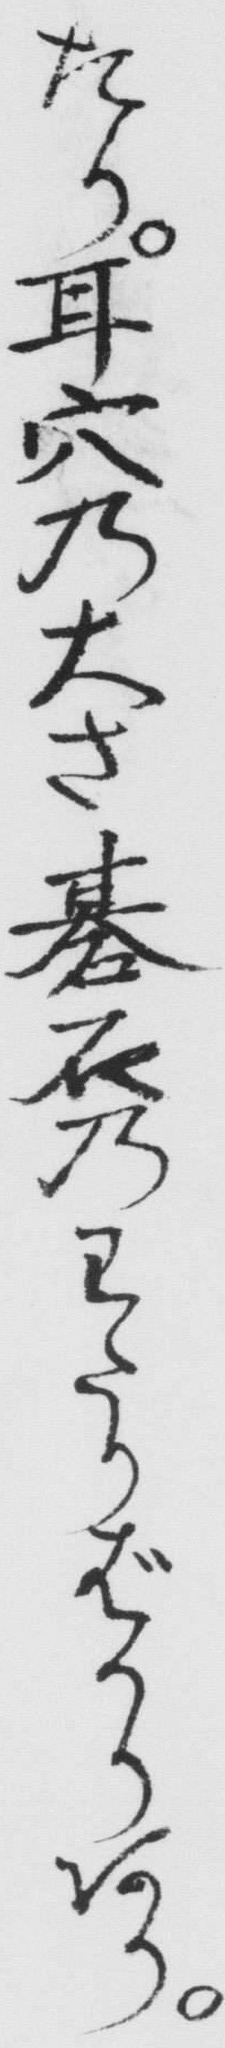たり。耳穴の大さ碁石のわたりばかりあり。
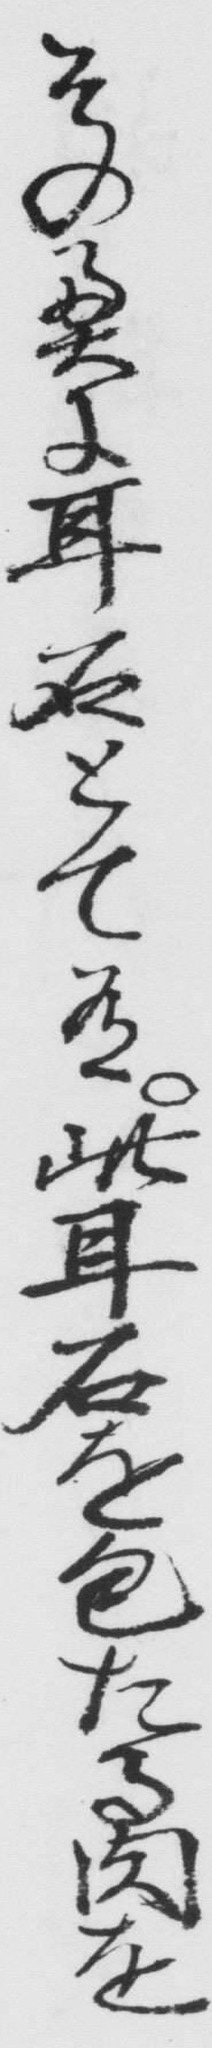その奥に耳石とて有。此耳石を包たる肉を
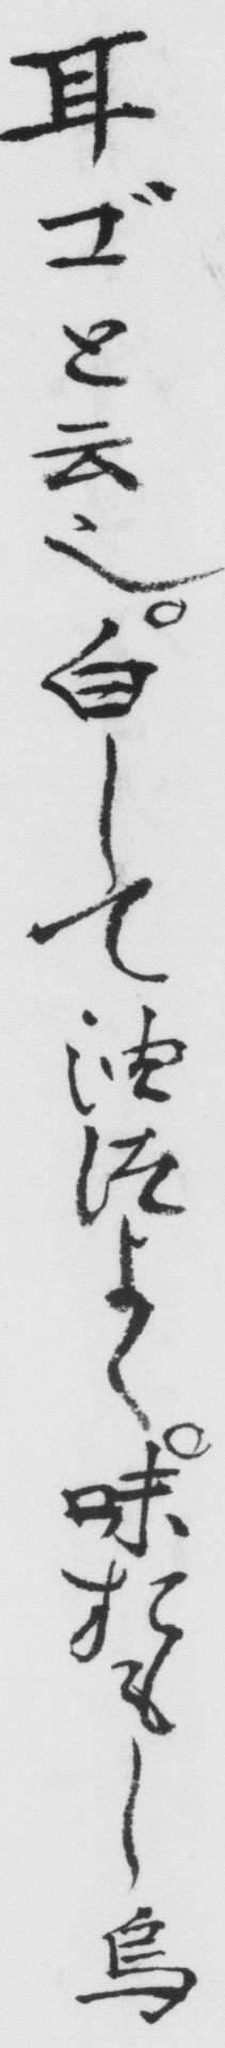耳ゴと云也。白して油つよく。味おもし烏
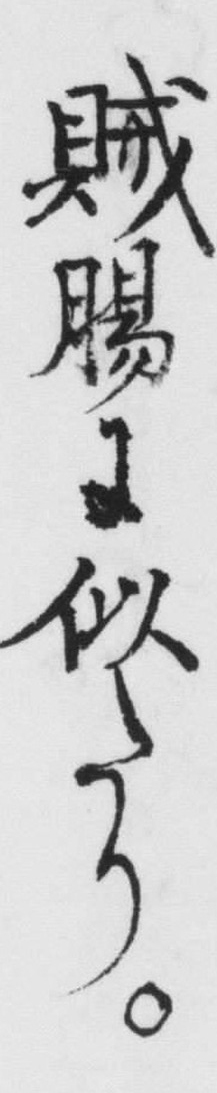賊腸に似たり。
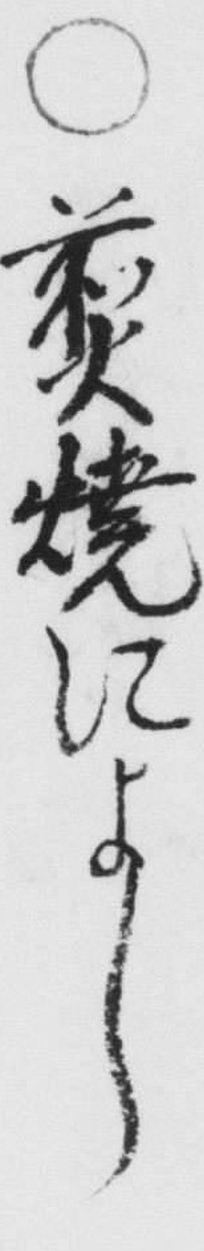○煎焼によし
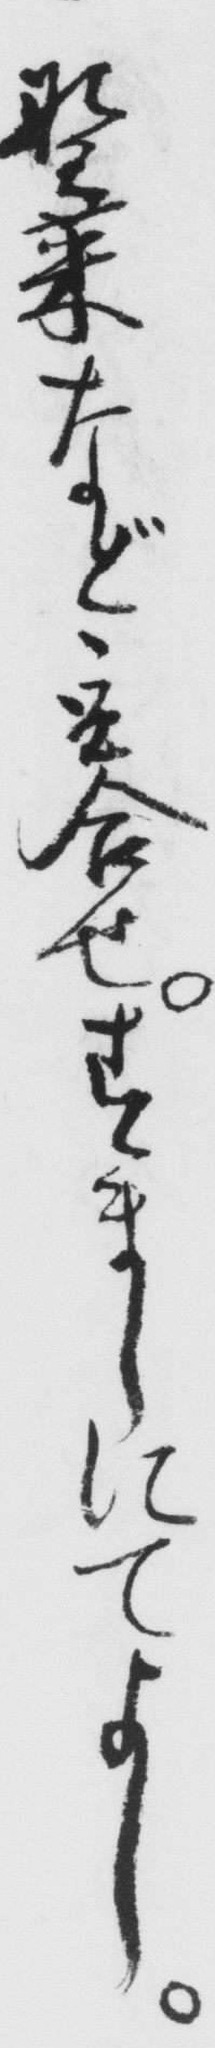○野菜など取合せ。すましにてよし。
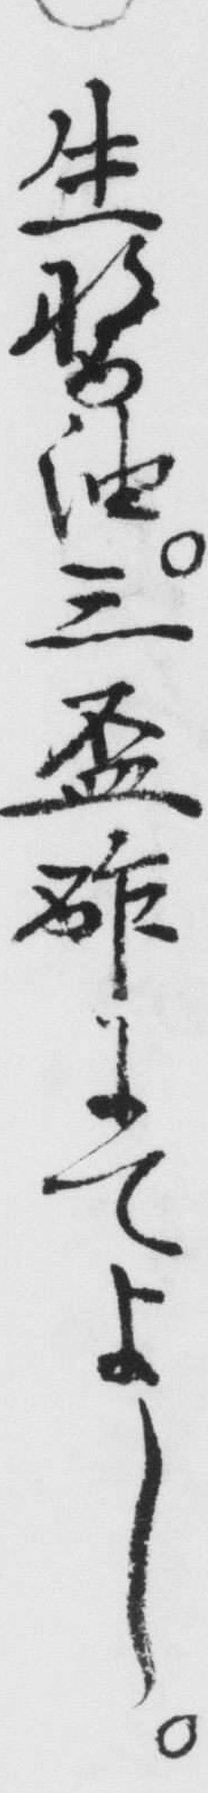○生醤油。三盃酢にてよし。
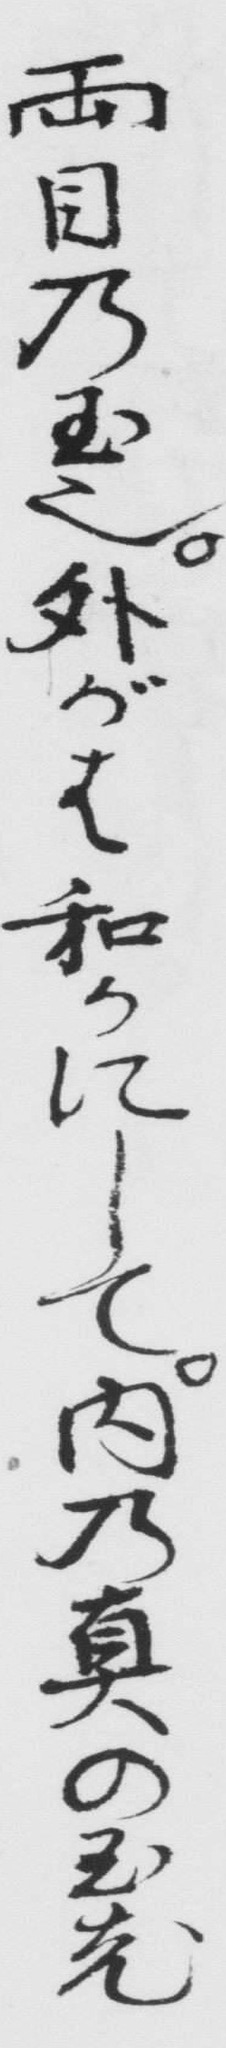眼の玉両目の玉也。外がは和かにして。内の真の玉老
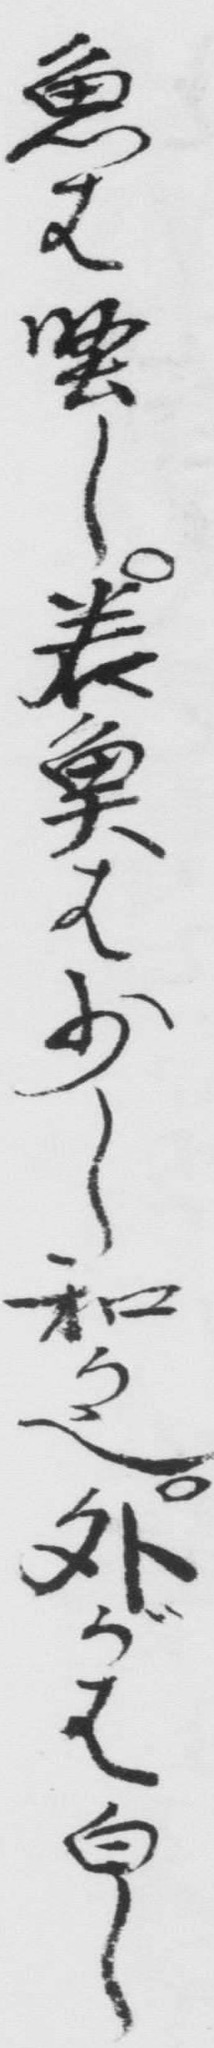魚は堅し。若魚は少し和か也。外がは白し
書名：鯨肉調味方
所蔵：大阪府立大学学術情報センター 国文学研究資料館
